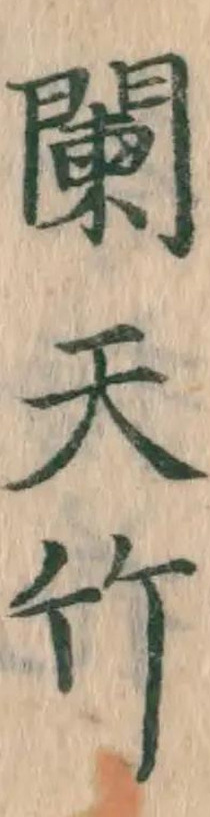闌天竹

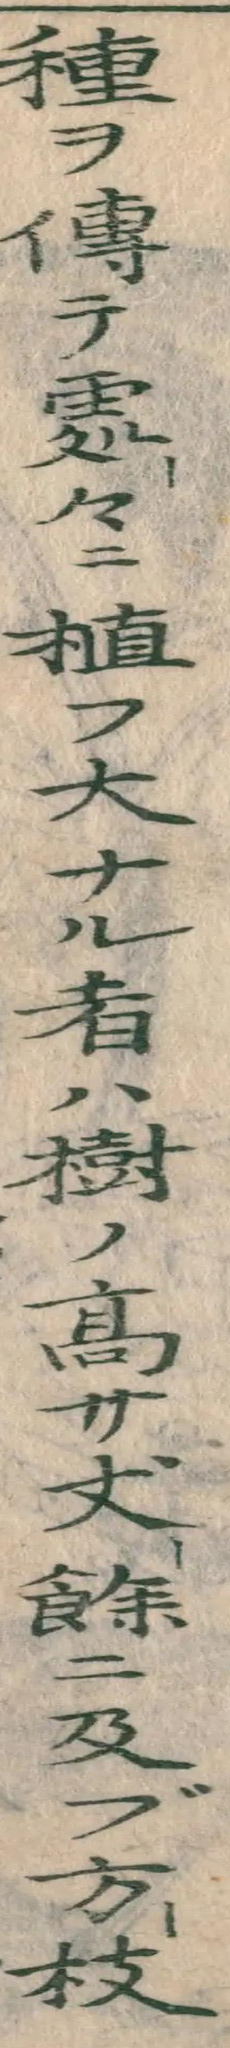種ヲ伝テ処-々ニ植フ大ナル者ハ樹ノ高サ丈-余ニ及ブ方-枝
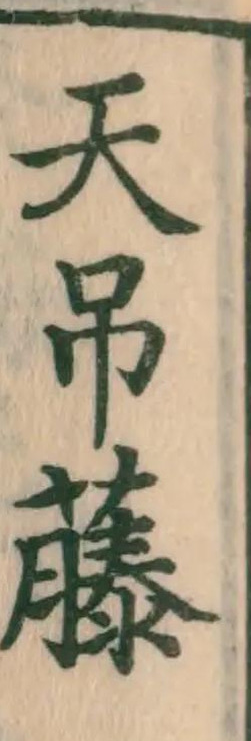天吊藤

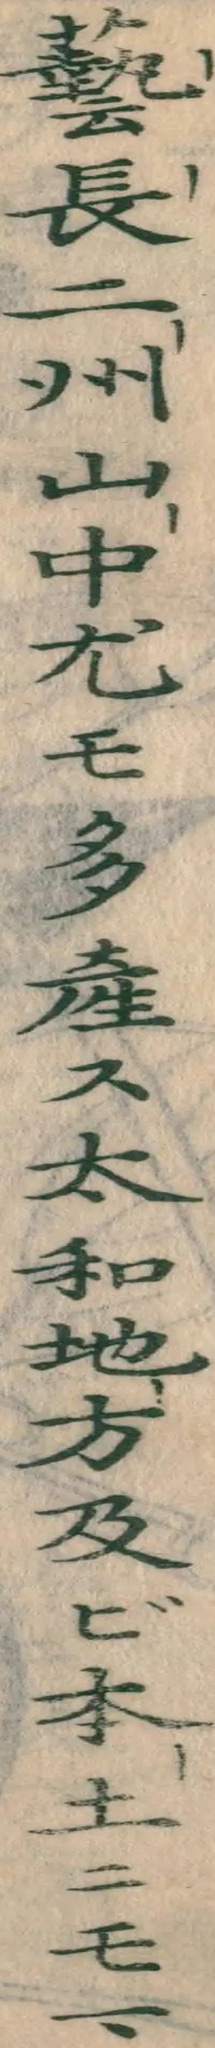芸長二-州山-中尤モ多産ス太和地-方及ビ本-土ニモマ
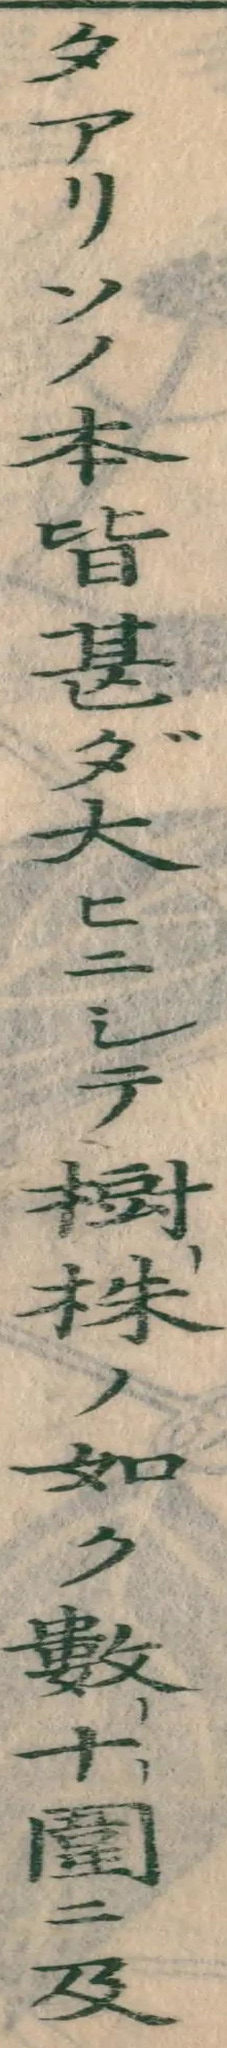タアリソノ本皆甚ダ大ヒニシテ樹-株ノ如ク数-十-囲ニ及
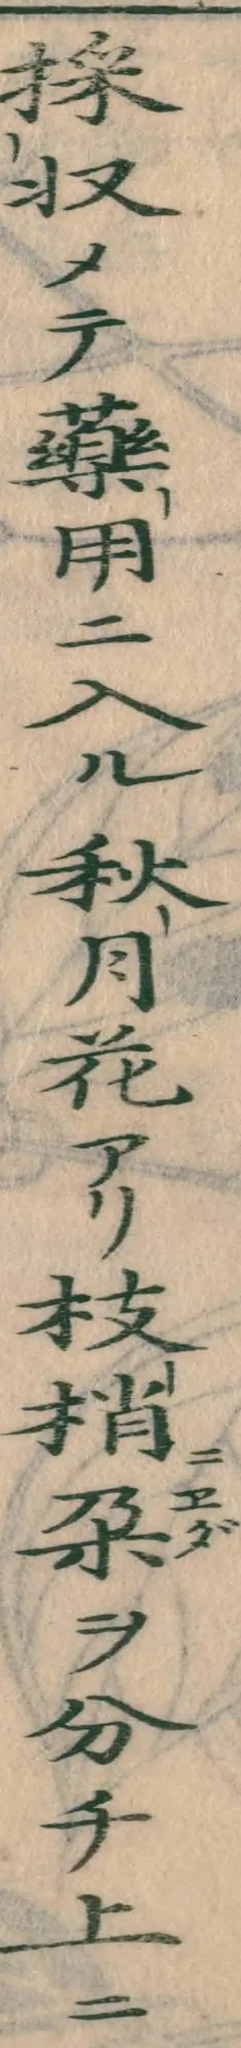採-収メテ薬-用ニ入ル秋-月花アリ枝-梢朶ヲ分チ上ニ
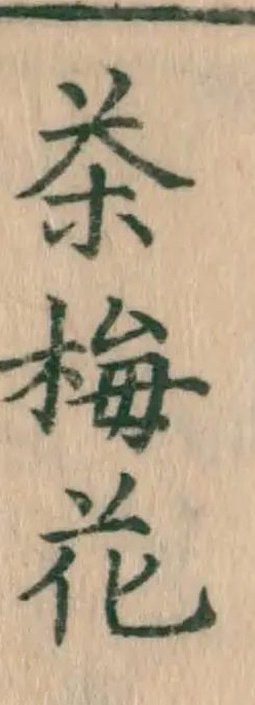茶梅花

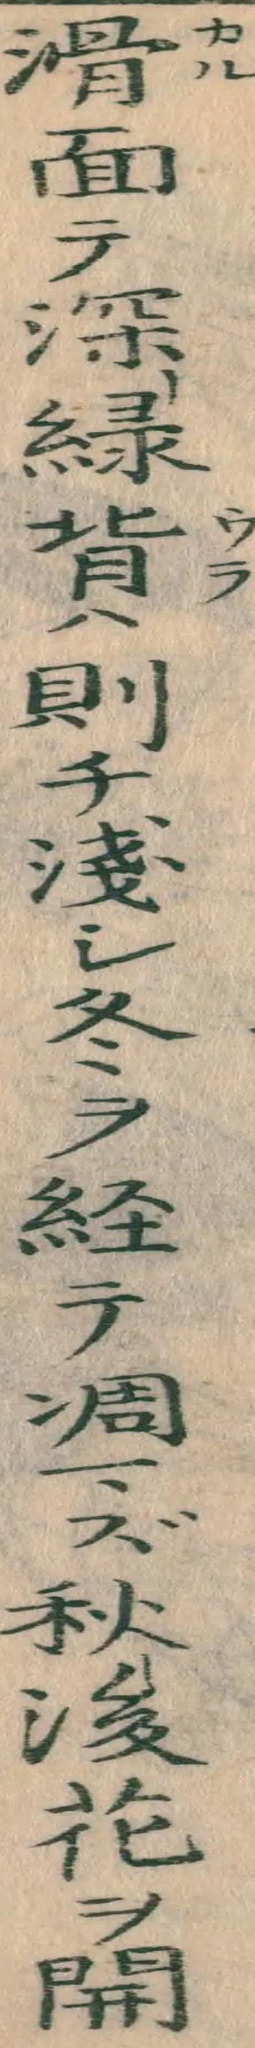滑面テ深-緑背ハ則チ浅シ冬ヲ経テ凋マズ秋-後花ヲ開
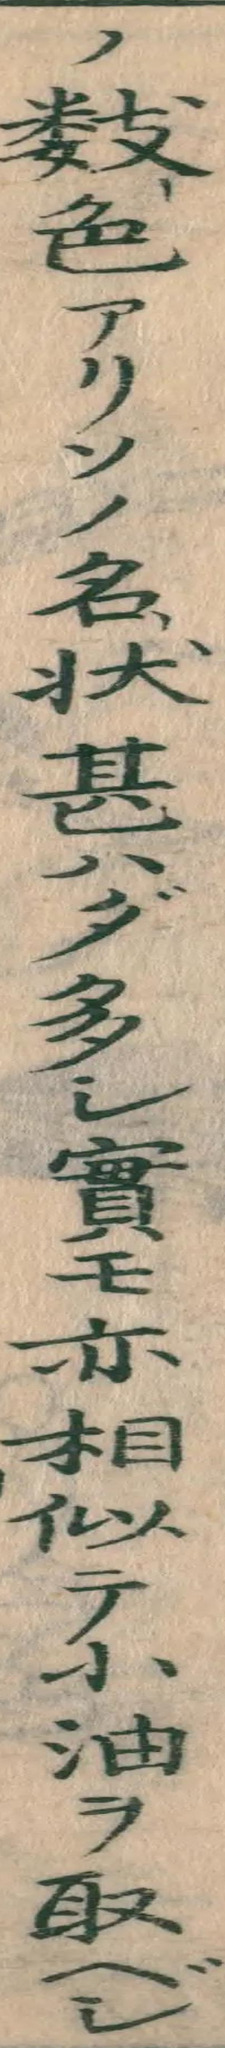ノ数-色アリソノ名-状甚ハダ多シ実モ亦相-似テ小油ヲ取ベシ

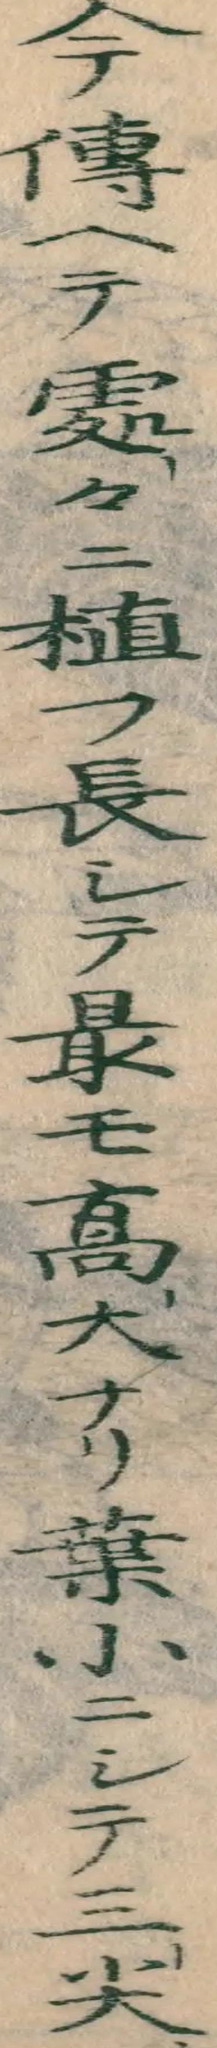今伝ヘテ処-々ニ植フ長シテ最モ高-大ナリ葉小ニシテ三-尖-
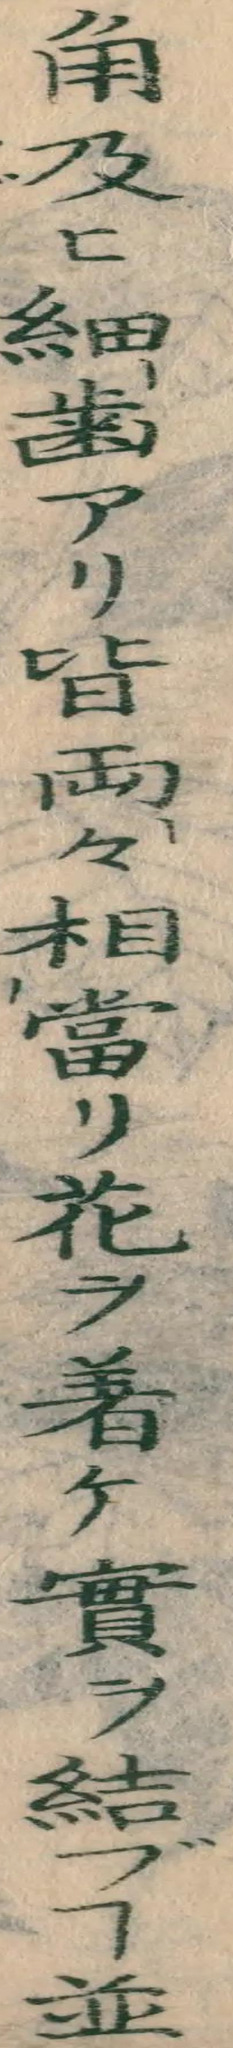角及ヒ細-歯アリ皆両-々相-当リ花ヲ着ケ実ヲ結ブヿ並
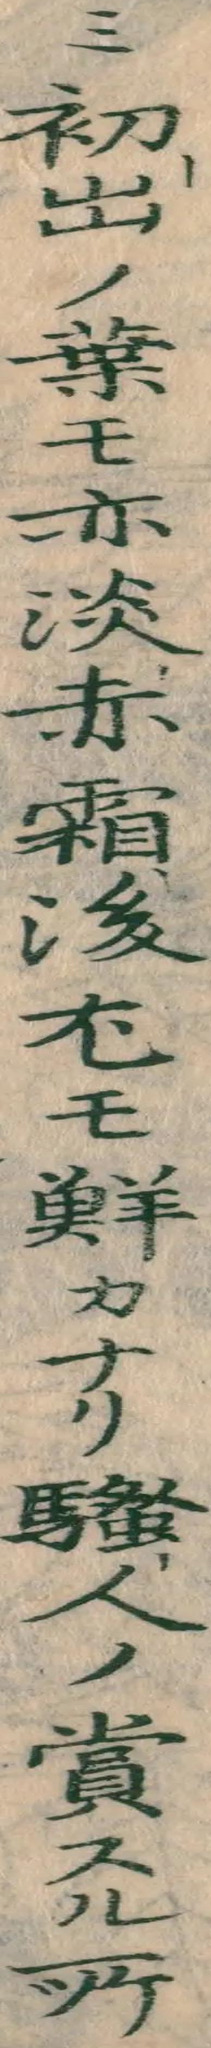ミ初-出ノ葉モ亦淡-赤霜-後尤モ鮮カナリ騒-人ノ賞スル所
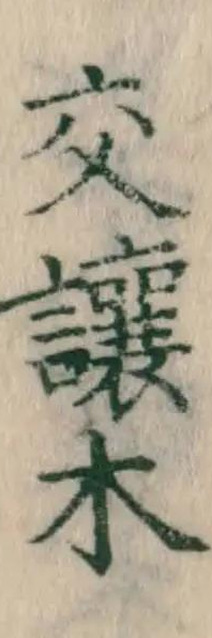交譲木

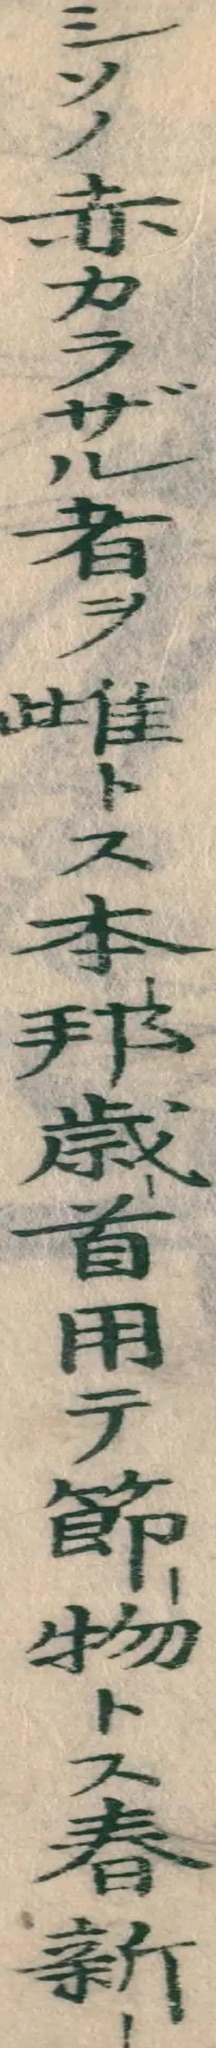シソノ赤カラザル者ヲ雌トス本-邦歳-首用テ節-物トス春新-
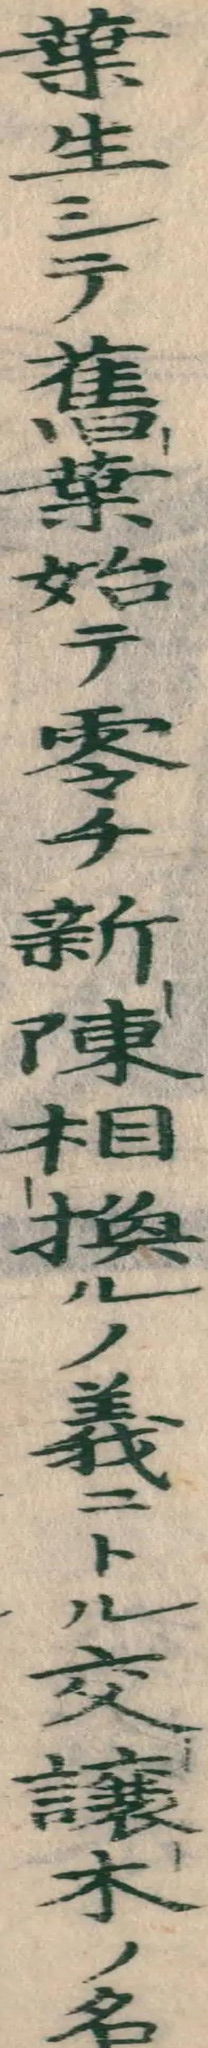葉生シテ旧-葉始テ零チ新-陳相-換ルノ義ニトル交-譲-木ノ名

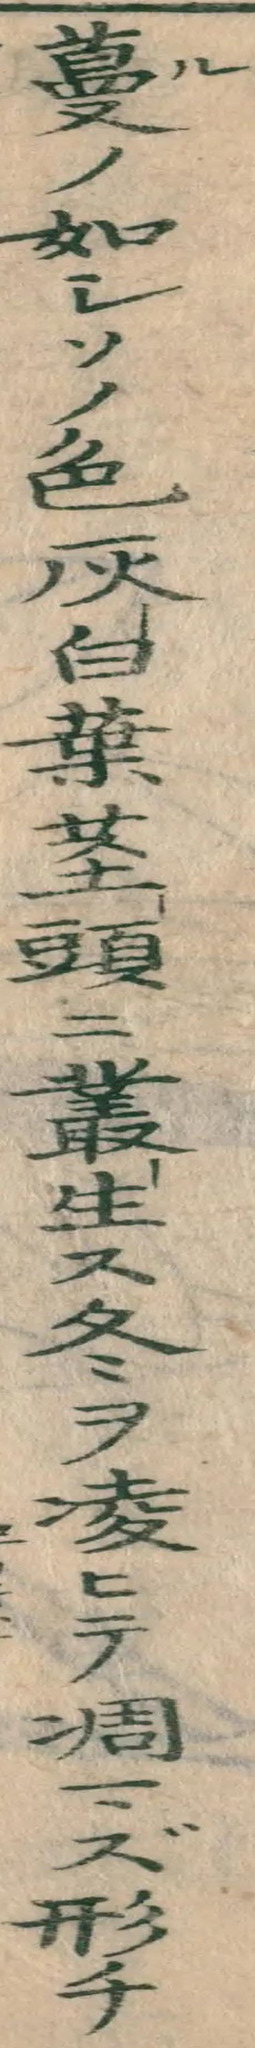蔓ノ如シソノ色灰-白葉茎-頭ニ叢-生ス冬ヲ凌ヒテ凋マズ形チ
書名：花彙 草部4巻木部4巻. [2]
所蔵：国立国会図書館 National Diet Library, JAPAN
